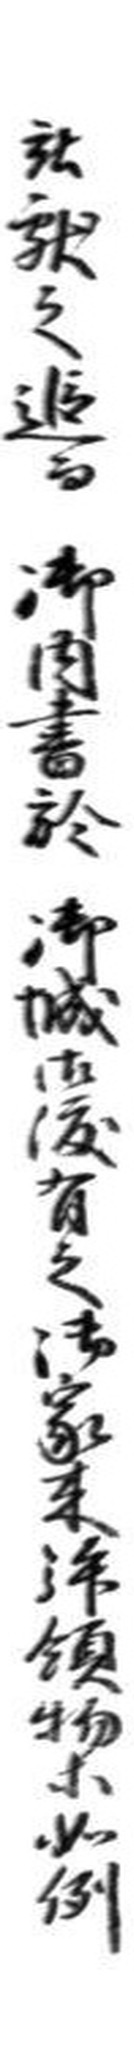被献之追而御内書於御城御渡有之御家来拝領物等如例
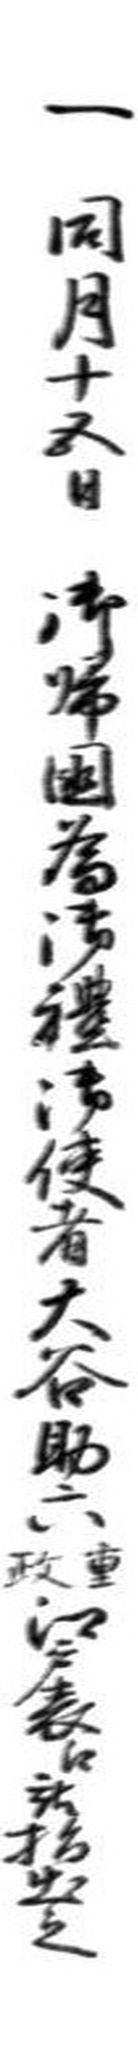一同月十五日御帰国為御礼御使者大谷助六重政江戸表江被指出之
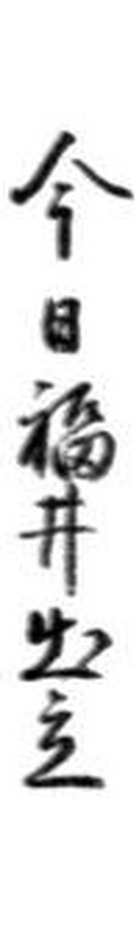今日福井出立
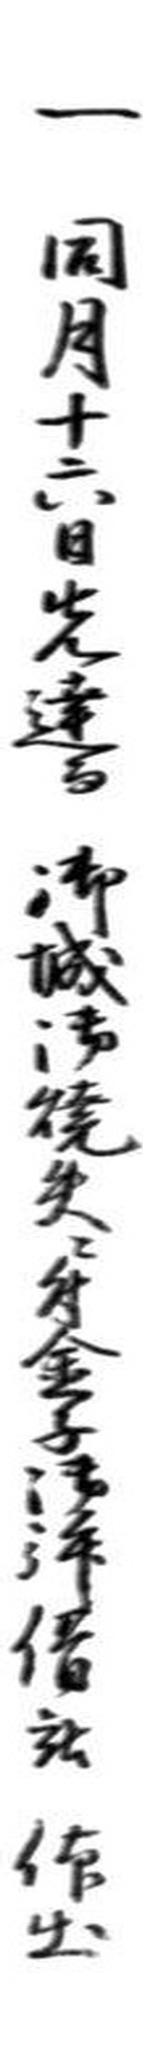一同月十六日先達而御城御焼失ニ付金子御拝借被仰出
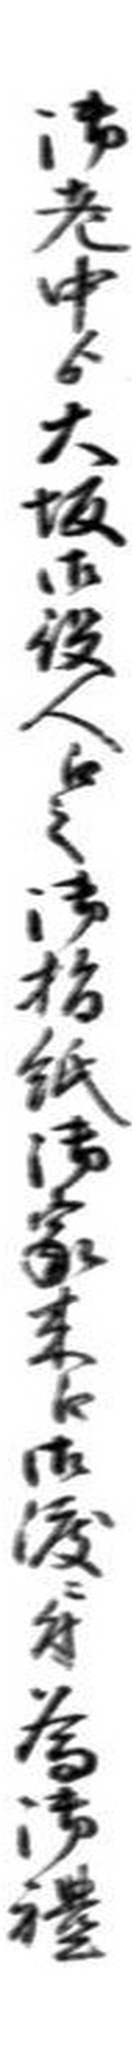御老中ゟ大坂御役人江之御指紙御家来江御渡ニ付為御礼
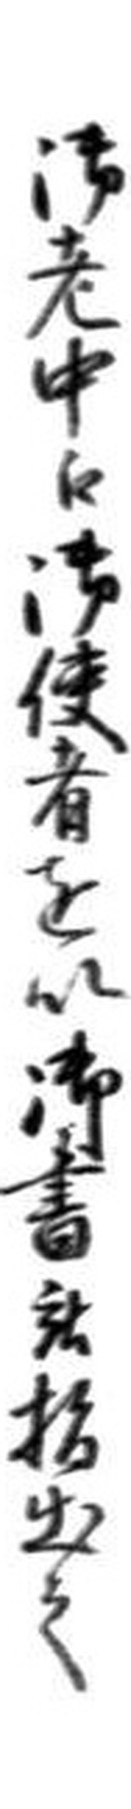御老中江御使者を以御諸書被指出之
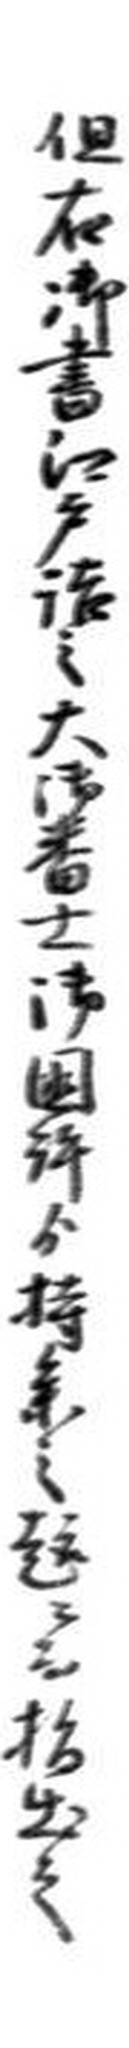但右御書江戸詰之大御番士御国許ゟ持参之趣ニ而指出之
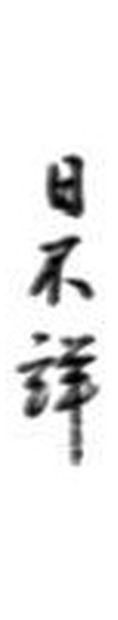日不詳
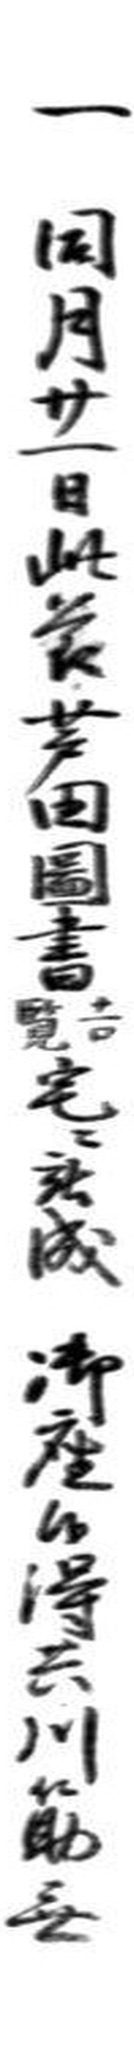一同月廿一日此節芦田図書吉賢宅ニ被成御座候得共川筋無
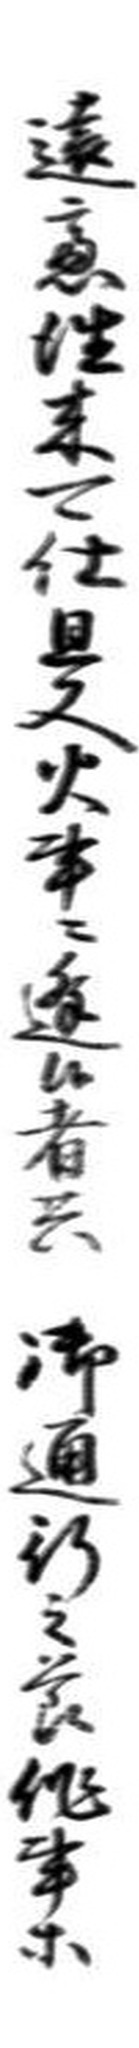遠慮往来可仕且又火事ニ逢候者共御通行之節作事等

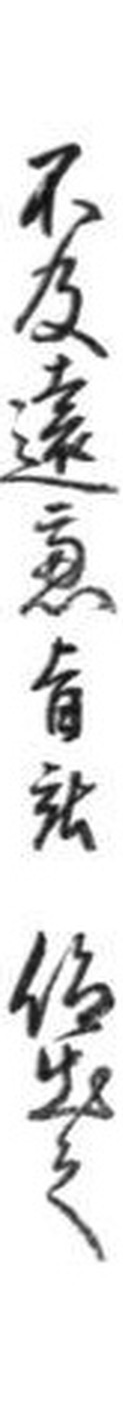不及遠慮旨被仰出之
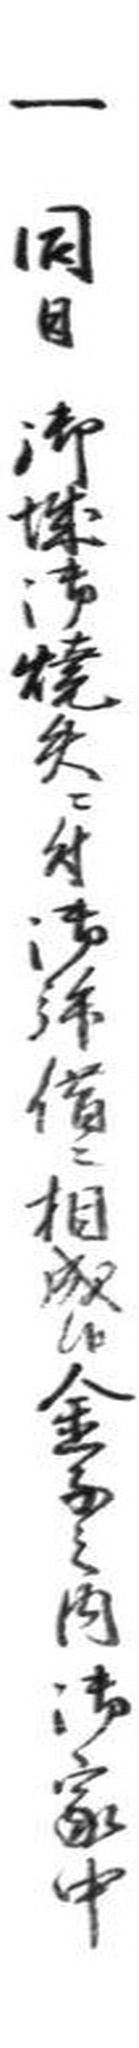一同日御城御焼失ニ付御拝借ニ相成候金子之内御家中
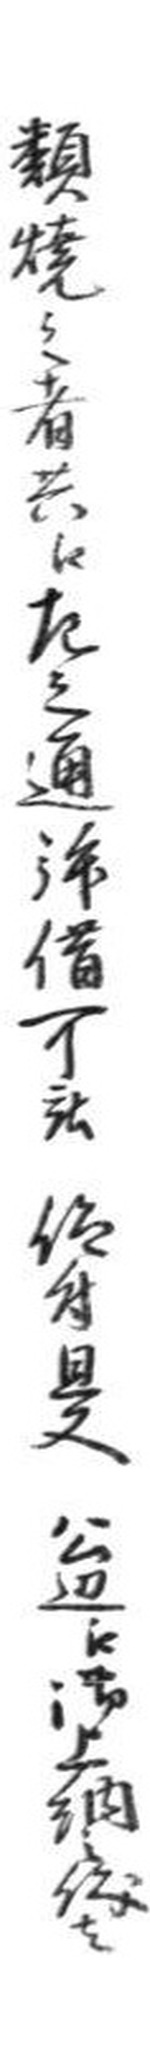類焼之者共江左之通拝借可被仰付且又公辺江御上納之儀者
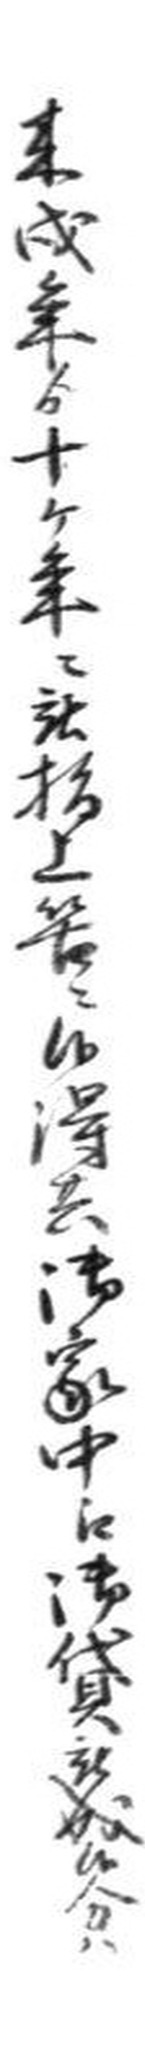来戌年ゟ十ヶ年ニ被指上筈ニ候得共御家中江御貸被成候分ハ
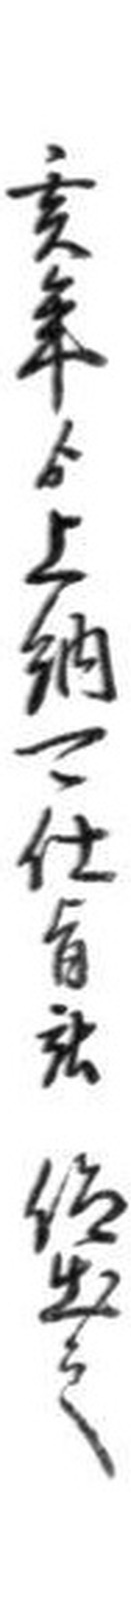亥年ゟ上納可仕旨被仰出之
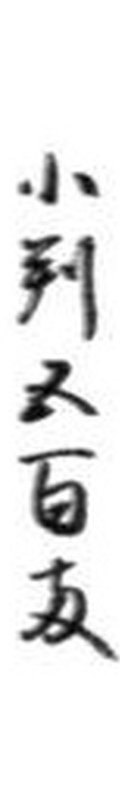小判五百両
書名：家譜 七 光通公 従寛文四年到同九年
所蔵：福井県文書館 Fukui Prefectural Archives
